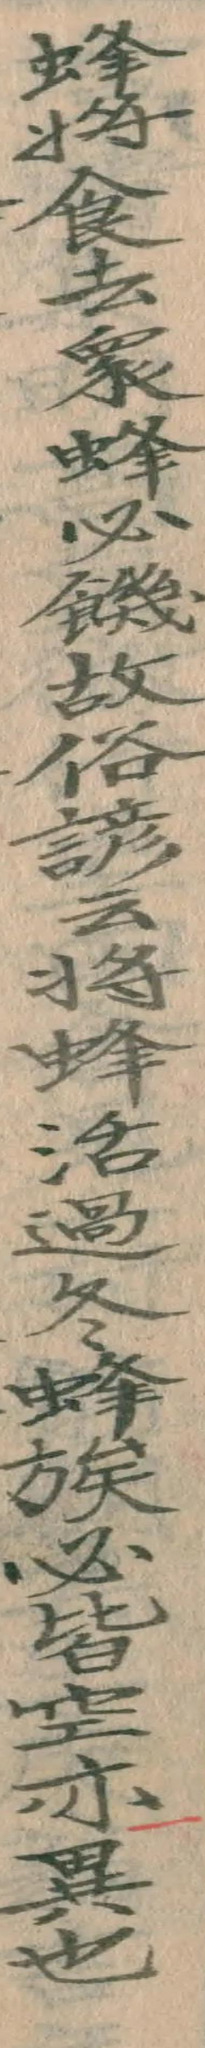蜂将食去衆蜂必饑故俗諺云将蜂活過冬蜂族必皆空亦異也
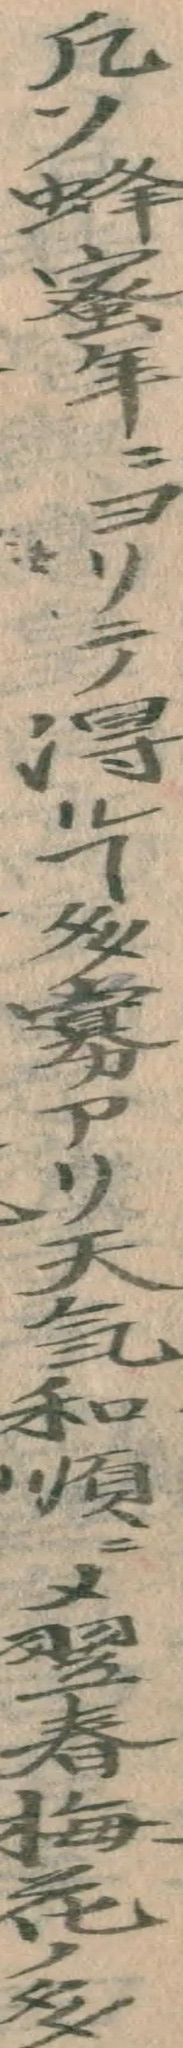凡ソ蜂蜜年ニヨリテ得ルコト多寡アリ天気和順ニシテ翌春梅花ノ多
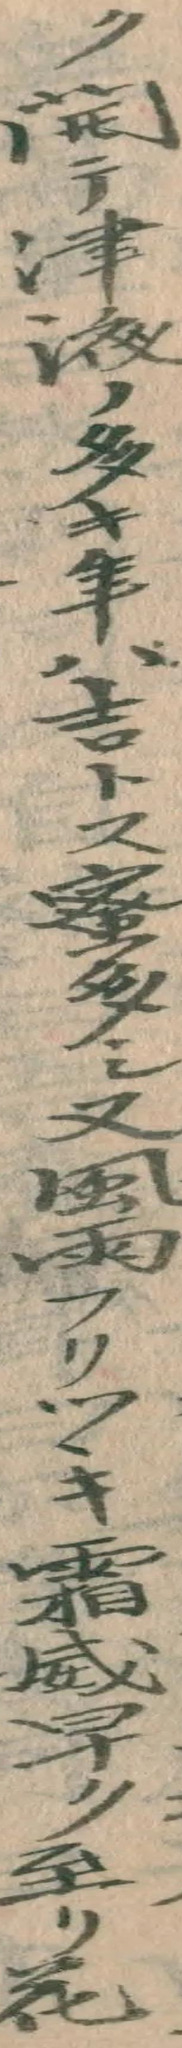ク開テ津液ノ多キ年ハ吉トス蜜多シ又風雨フリツヽキ霜威早ク至リ花
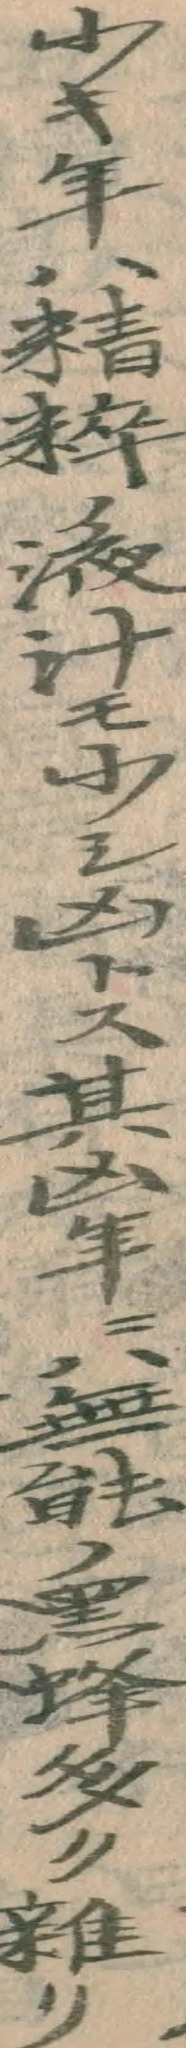少キ年ハ精粹ノ液汁モ少シ凶トス其凶年ニハ無能ノ黒蜂多ク雜リ
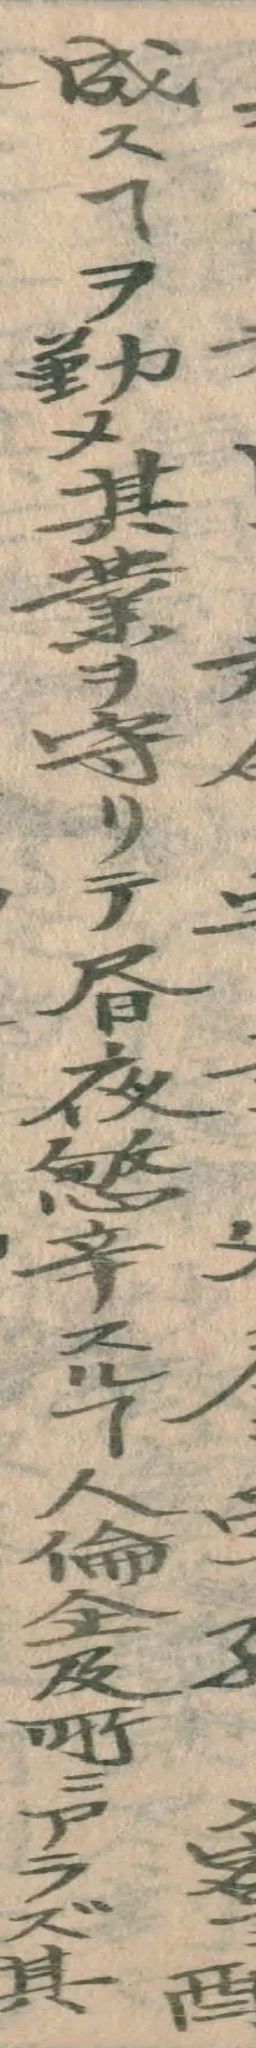成スコトヲ勤メ其業ヲ守リテ昼夜憼辛スルコト人倫企及所ニアラズ其
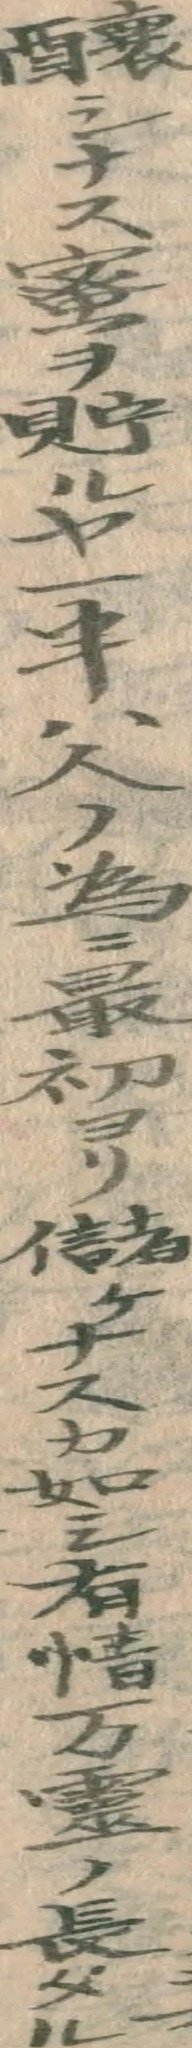醸シナス蜜ヲ貯ルヤ一半ハ人ノ為ニ最初ヨリ儲ケナスカ如シ有情万靈ノ長タル
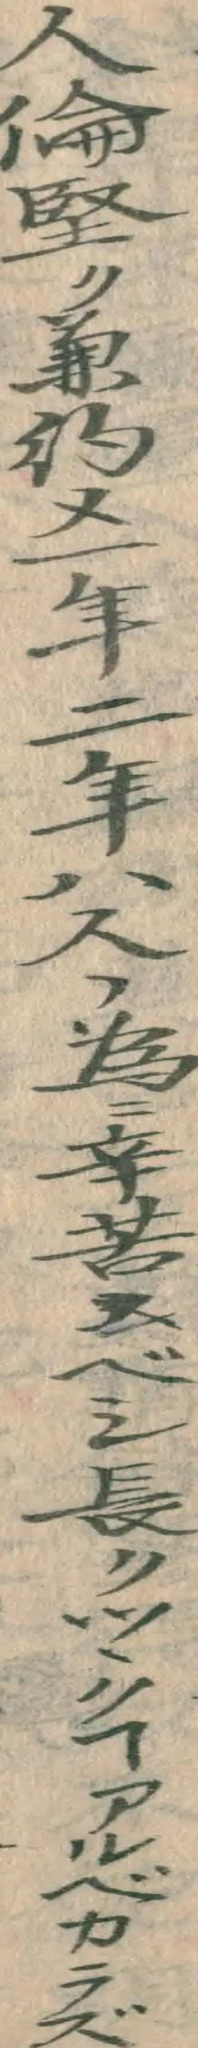人倫堅ク兼約シテ一年二年ハ人ノ為ニ辛苦シスベシ長クツヽクコトアルベカラズ
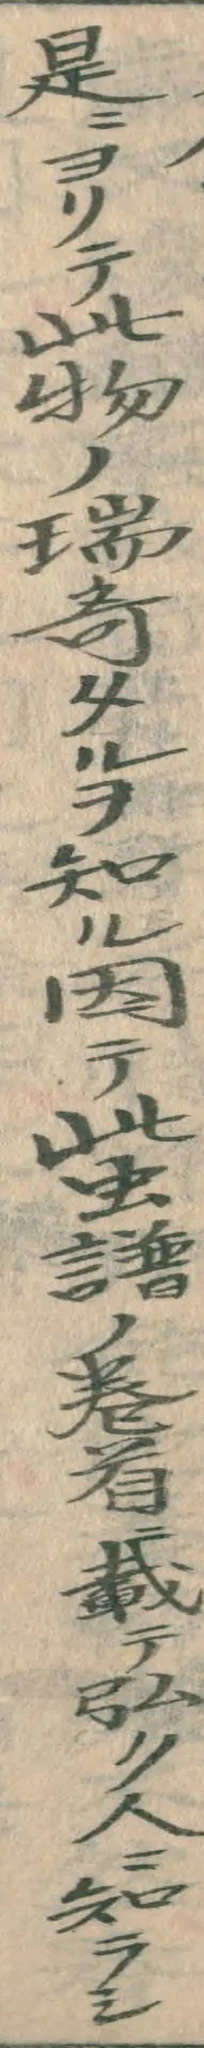是ニヨリテ此物ノ瑞奇タルヲ知ル因テ此虫譜ノ巻首ニ載テ弘ク人ニ知ラシ
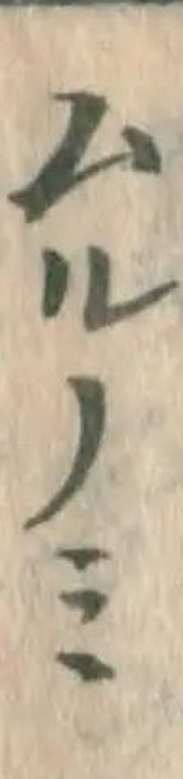ムルノミ

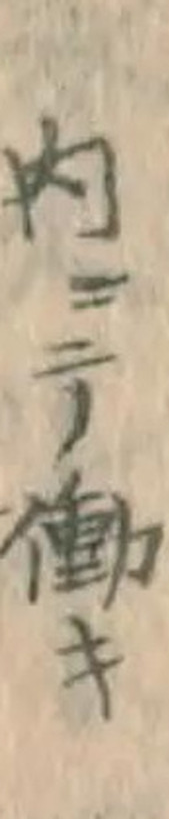内ニテ働キ
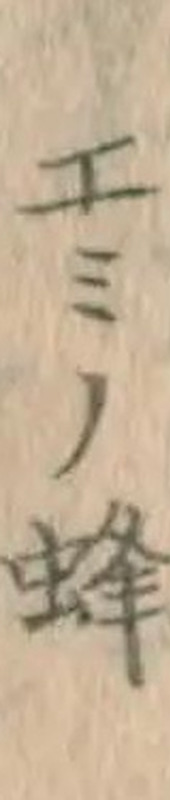エミノ蜂
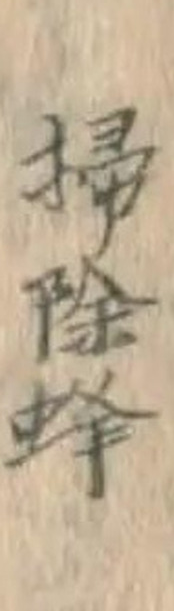掃除蜂
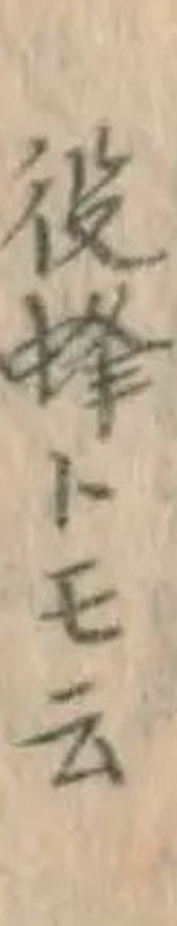役蜂トモ云
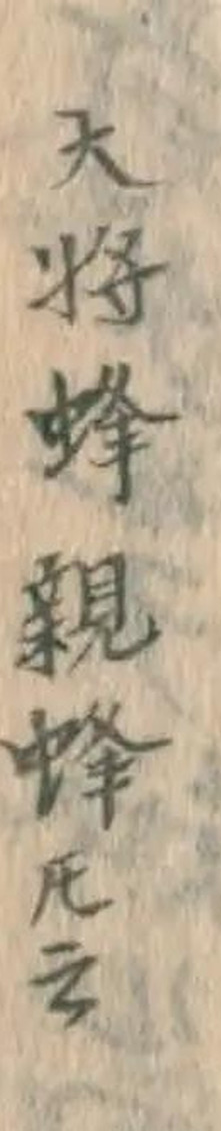大将蜂親蜂トモ云
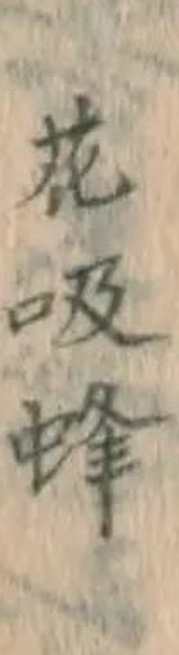花吸蜂
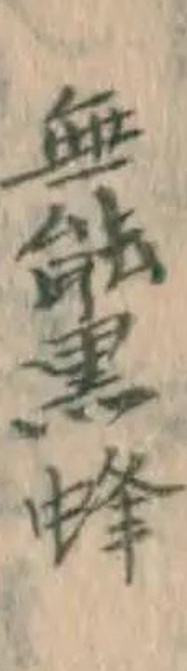無能黒蜂
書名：千蟲譜 3巻. [1]
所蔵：国立国会図書館 National Diet Library, JAPAN
